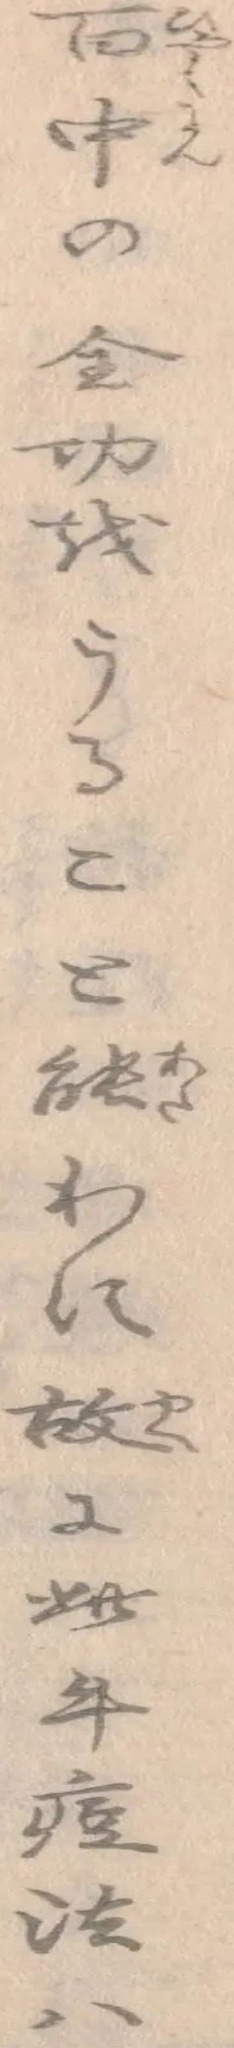百中の金功をうること能わす故に此牛痘法は
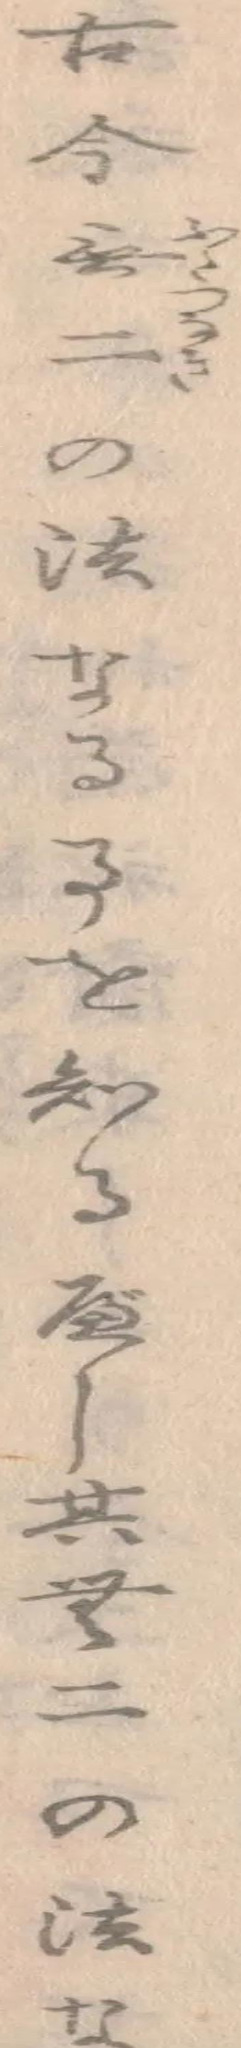古今無二の法なる事を知るべし其無二の法な
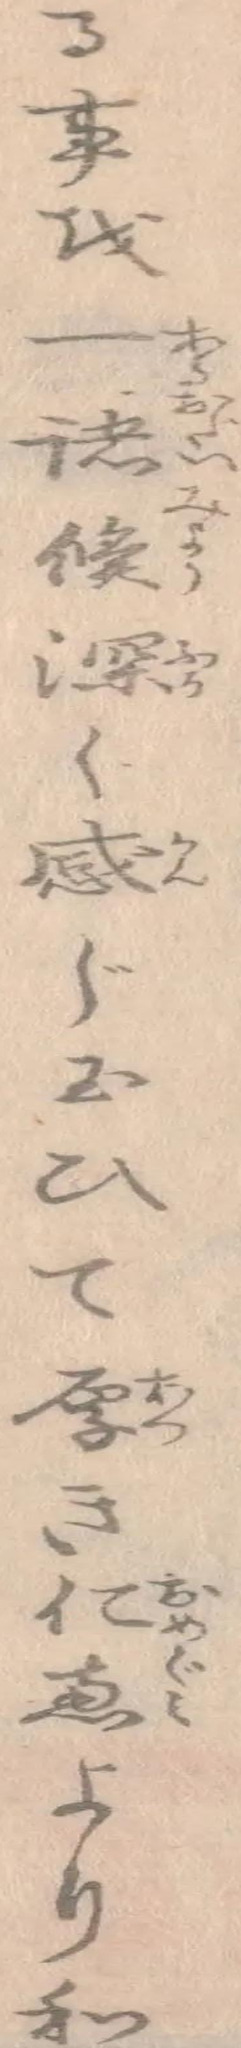る事を一諸侯深く感じ玉ひて厚き仁恵より和
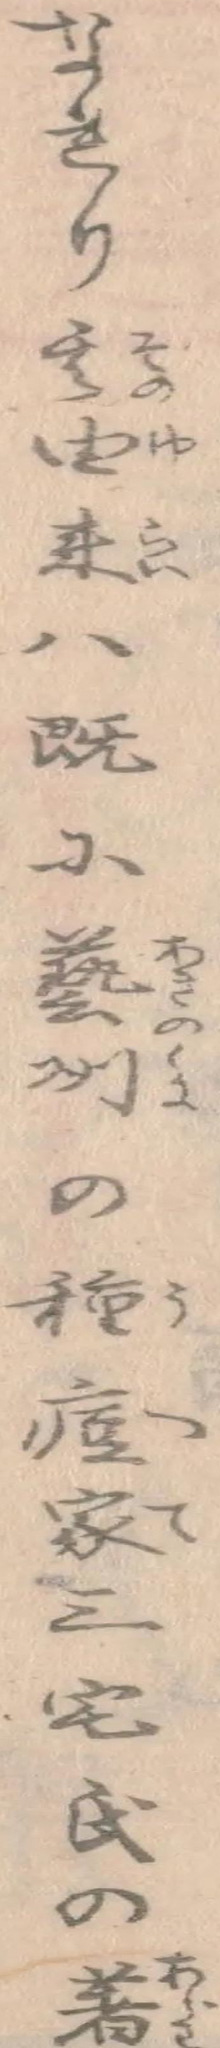なれり其由来は既に芸州の種痘家三宅氏の著
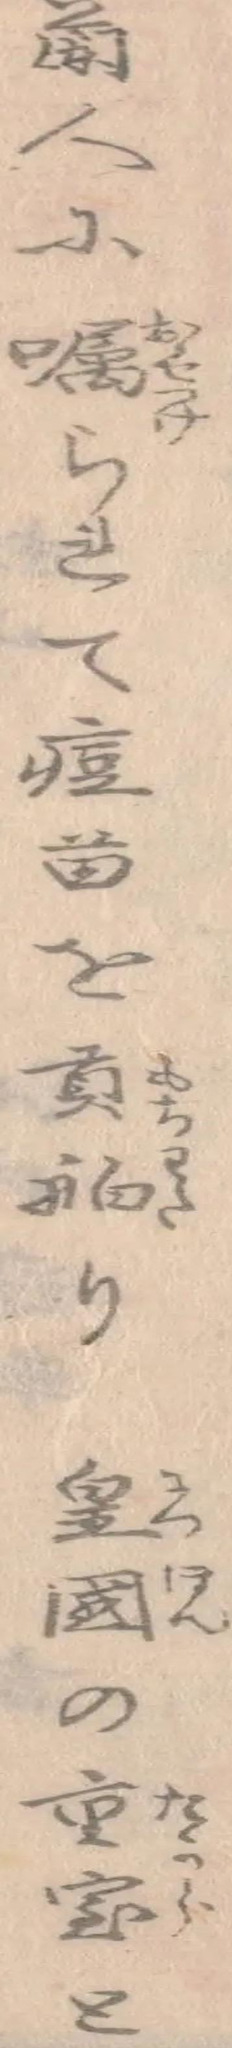蘭人に嘱られて痘苗を貢舶り皇国の重宝と
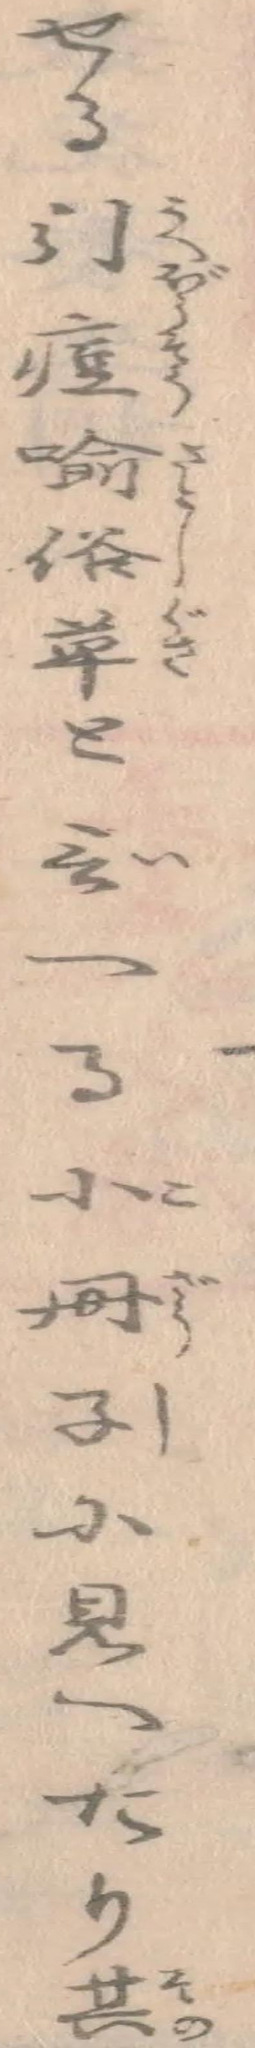せる引痘喩俗草と云へる小冊子に見えたり其
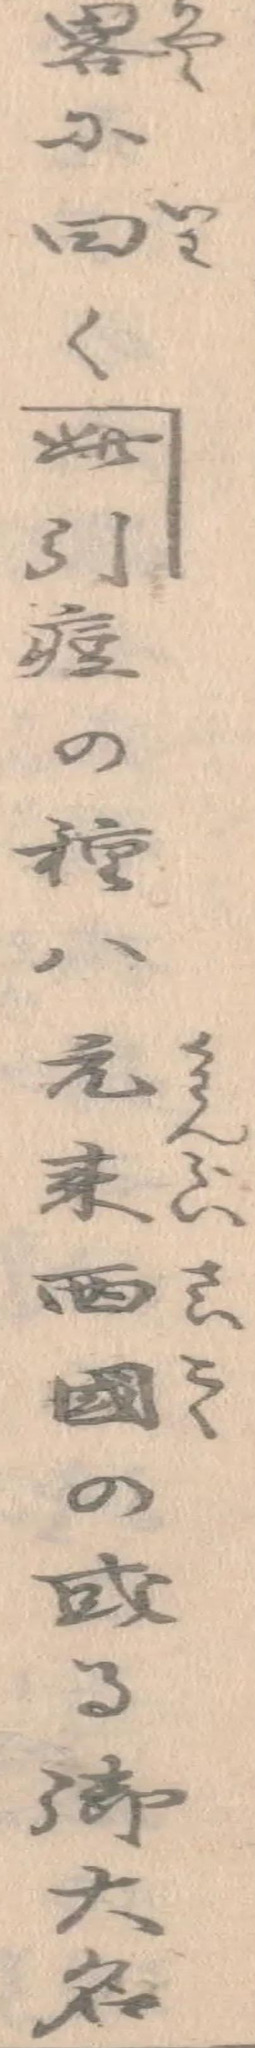略に曰くヿ此引痘の種は元来西国の或る御大名
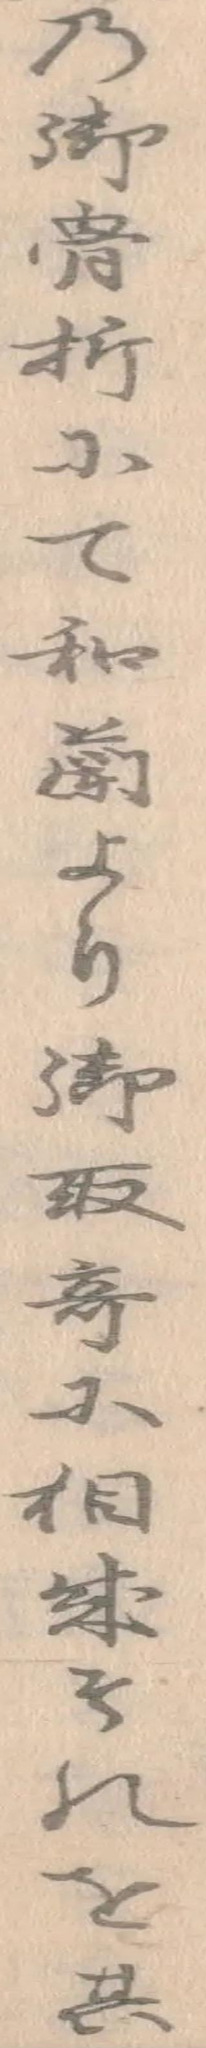の御骨折りにて和蘭より御取奇に相成それを其
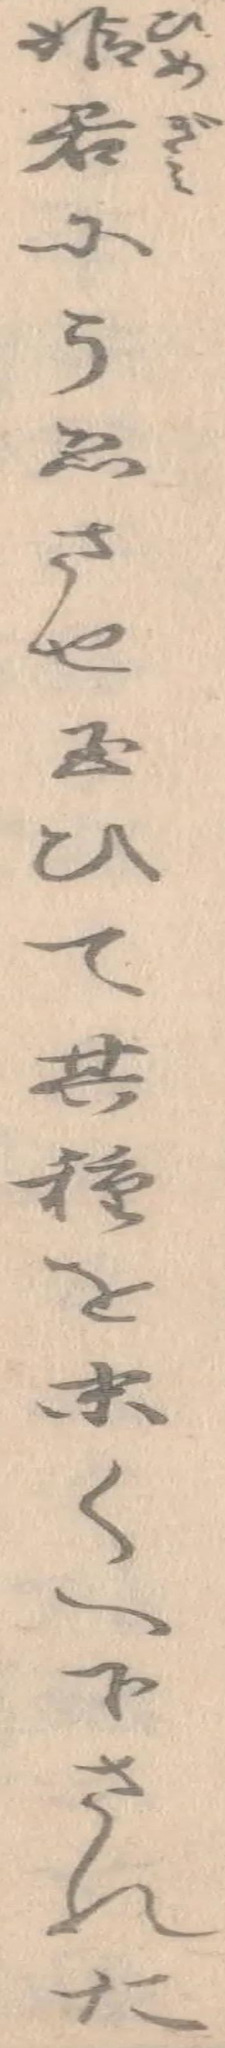姫君にうゑさせ玉ひて其種を末〳〵へ下された
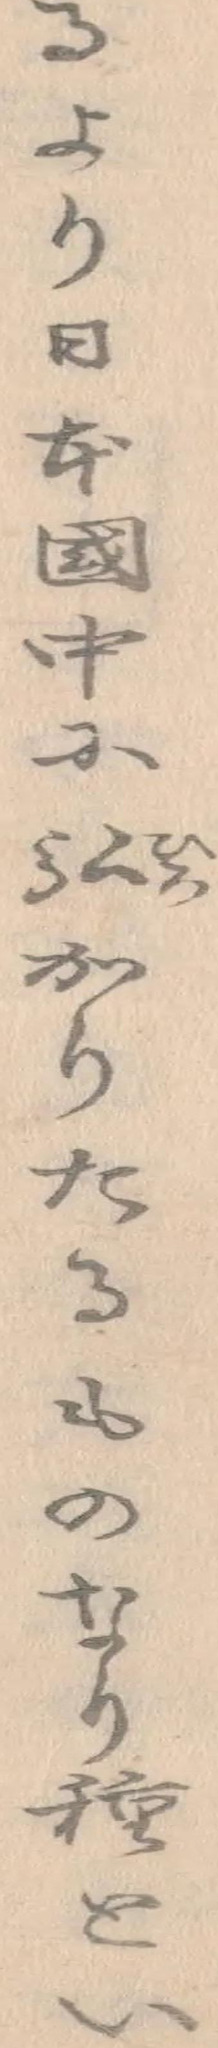るより日本国中に弘かりたるものなり種とい
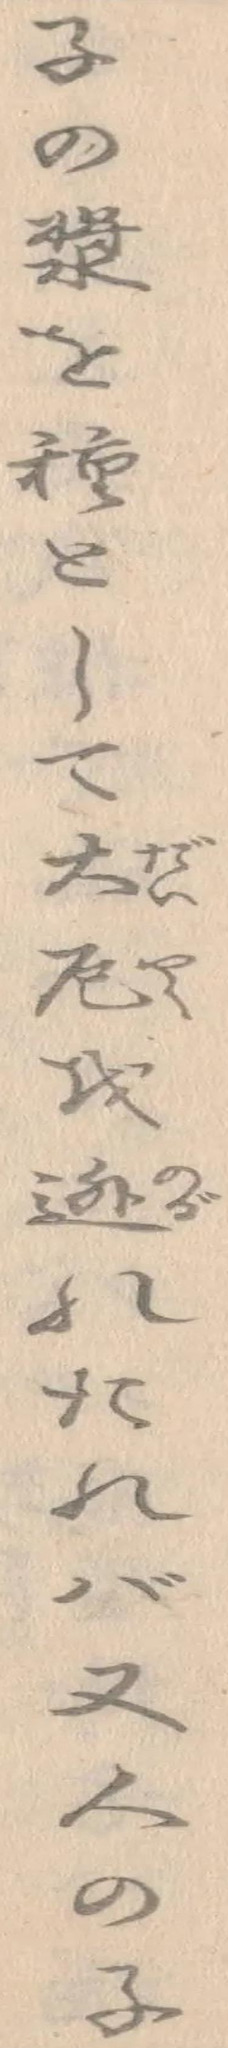この漿を種として大厄を逃れたれは又人の子
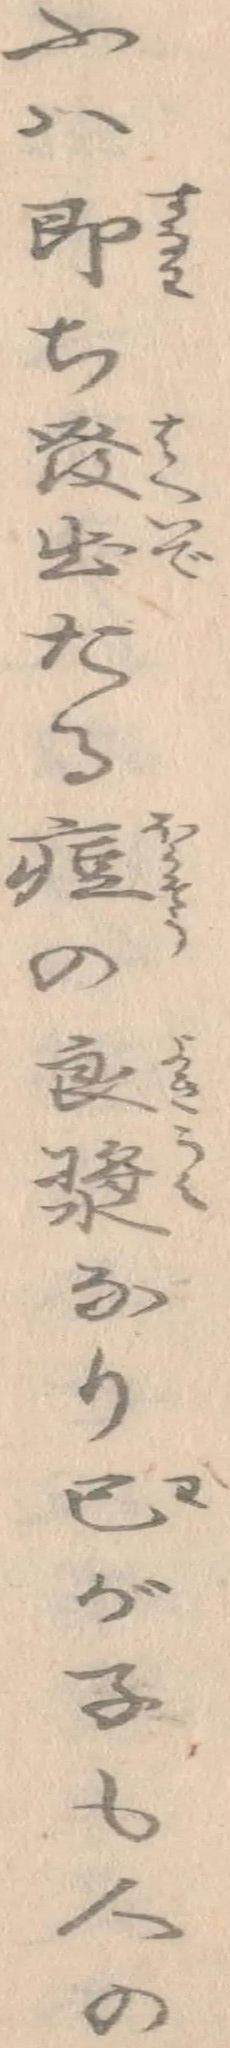ふは即ち発出たる痘の良漿なり己が子も人の
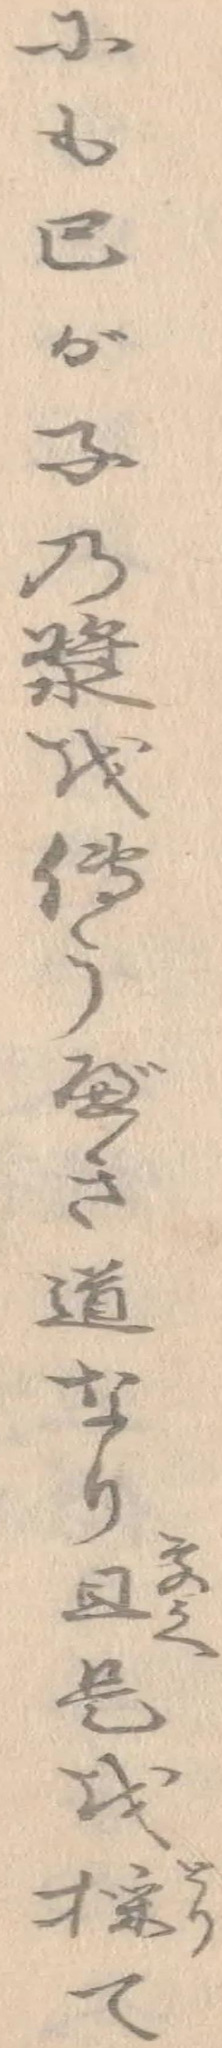にも己が子乃漿を伝うべき道なり且是を採て
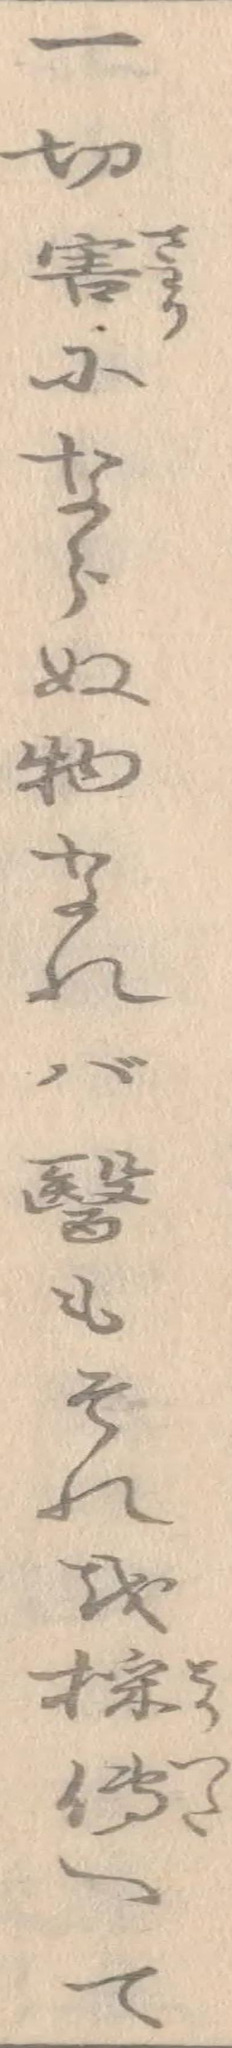一切害にならぬ物なれば醫もそれを採伝へて
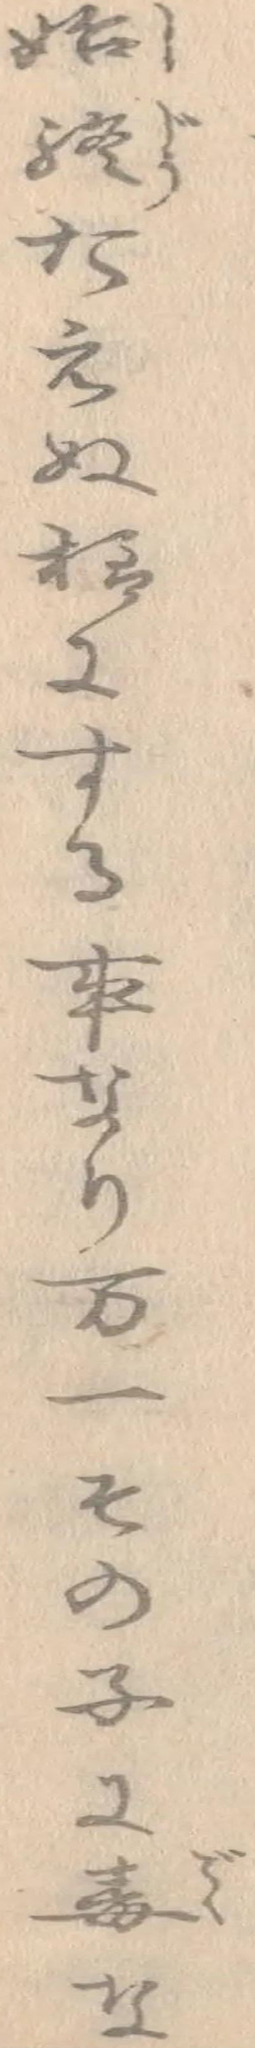始終たえぬ様にする事なり万一その子に毒な
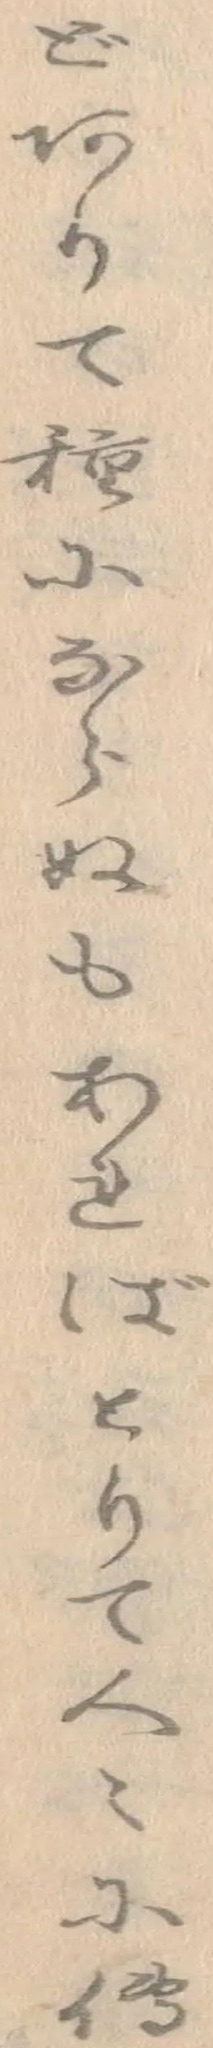どありて種にならぬもあればとりて人々に傳
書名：散花養生訓
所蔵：国立国会図書館 National Diet Library, JAPAN
